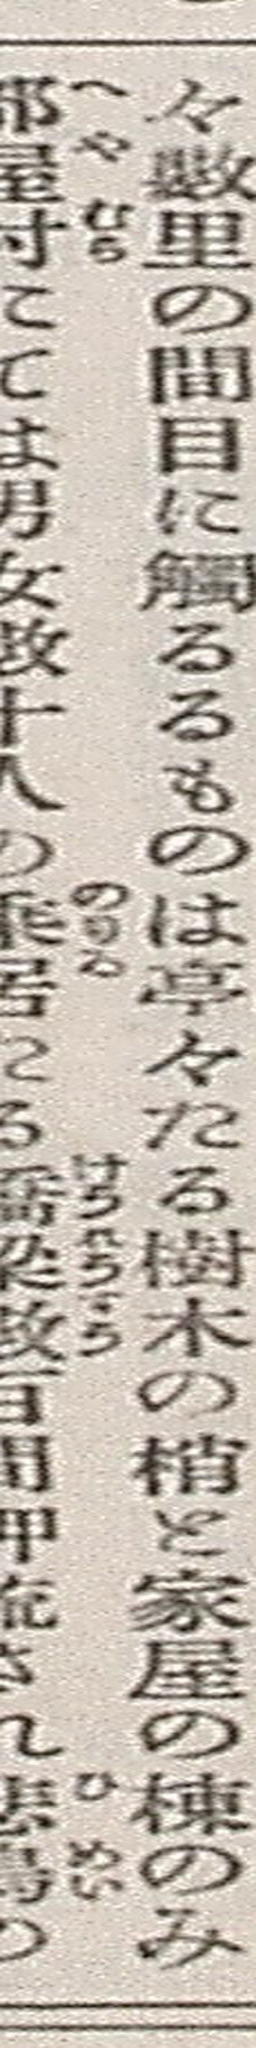部屋村にては男女数十人の乗居たる橋梁数百間押流され悲鳴の
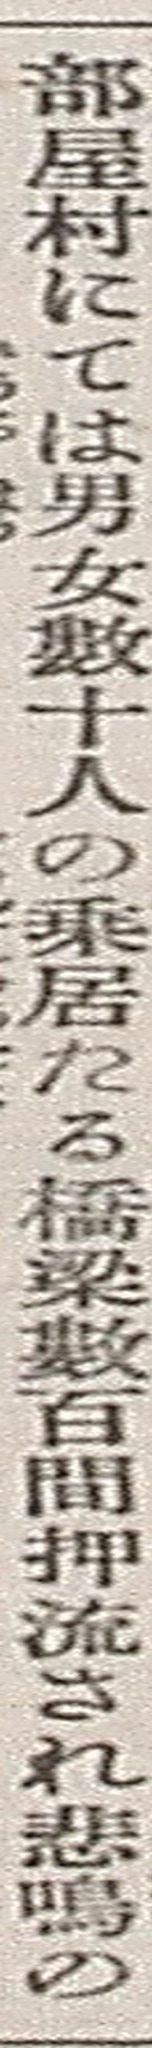部屋村にては男女数十人の乗居たる橋梁数百間押流され悲鳴の
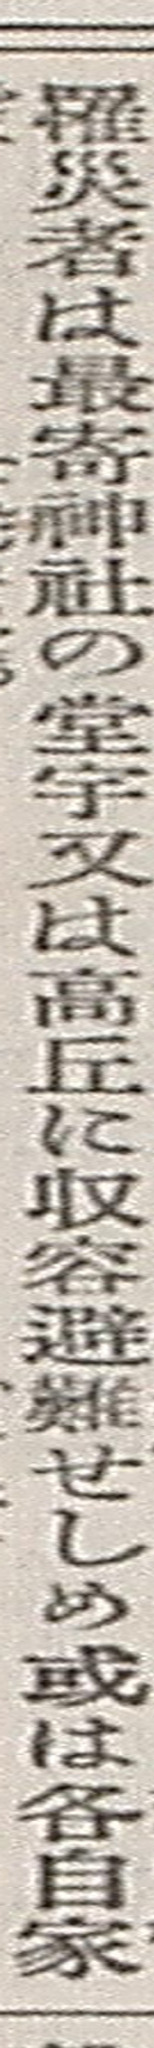罹災者は最寄神社の堂宇又は高丘に収容避難せしめ或は各自家
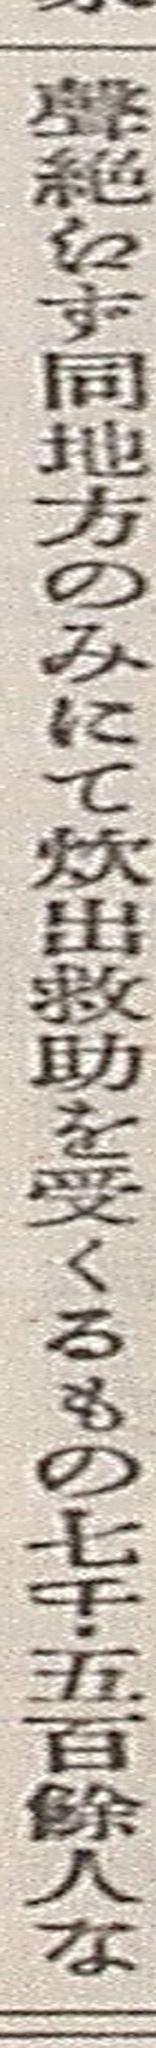声絶えず同地方のみにて焚出救助を受くるもの七千五百餘人な
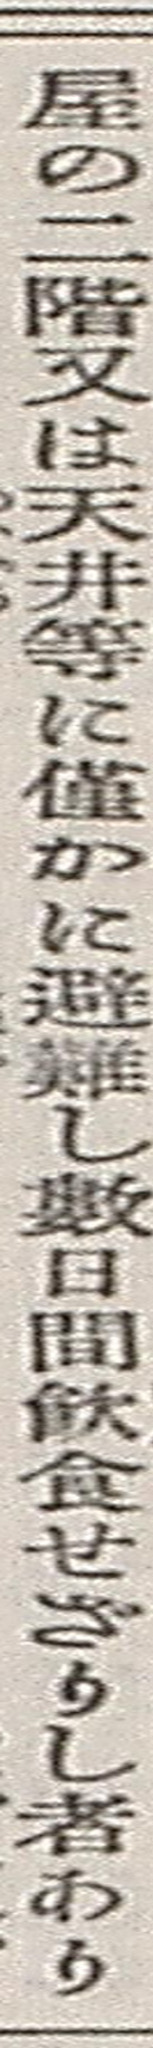屋の二階又は天井等に僅かに避難し数日間飲食せざりし者あり
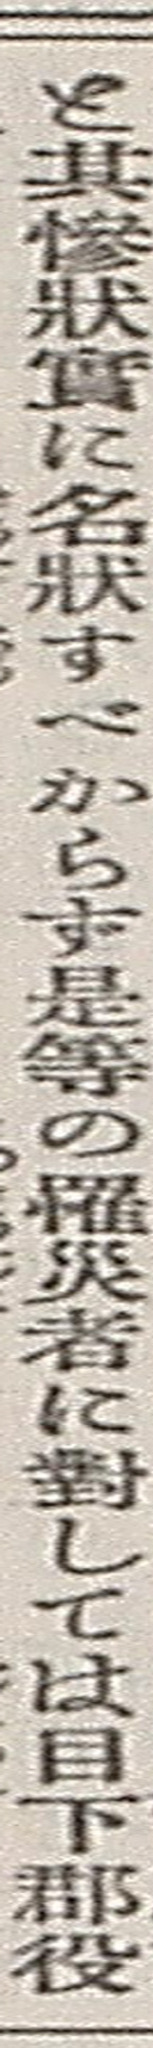と其惨状実に名状すべからず是等の罹災者に対しては目下郡役
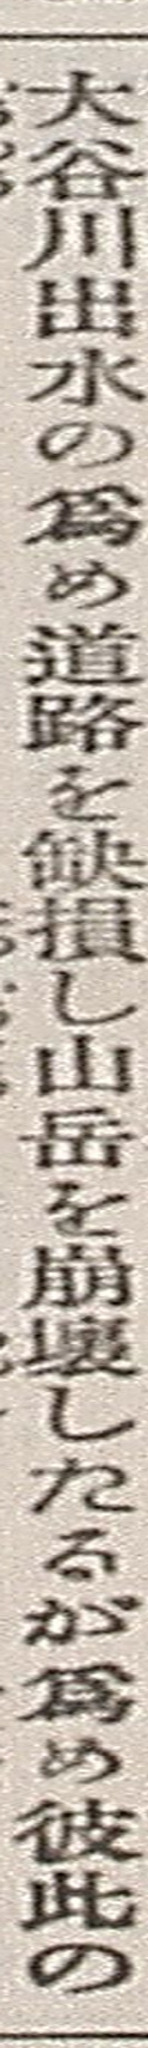大谷川出水の為め道路を缺損し山岳を崩壊したるが為め彼此の
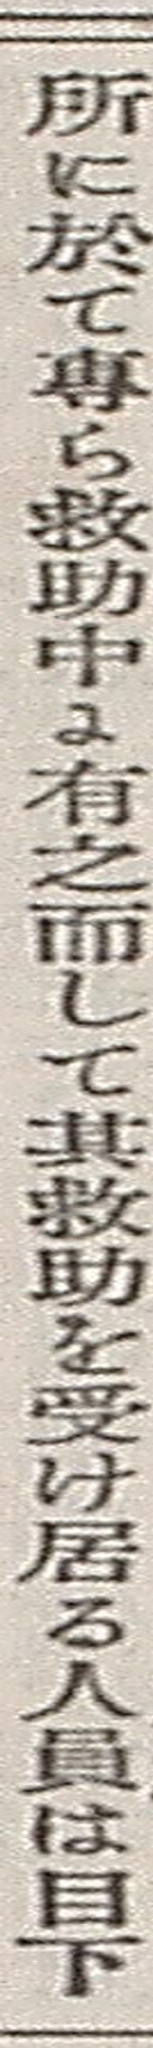所に於て専ら救助中に有之而して其救助を受け居る人員は目下
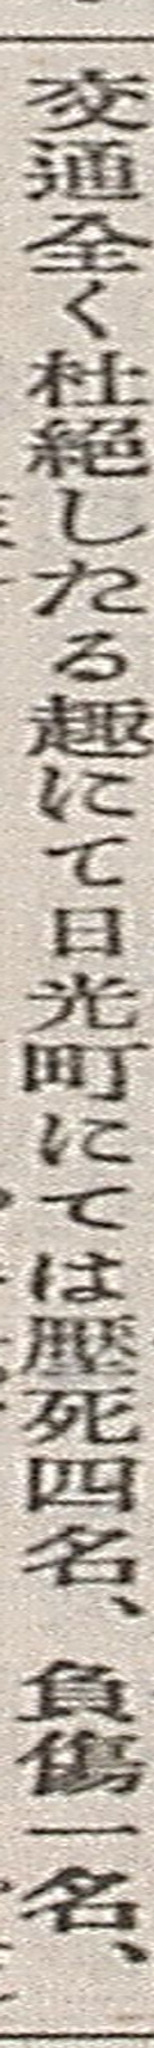交通全く杜絶したる趣にて日光町にては壓死四名、負傷一名、
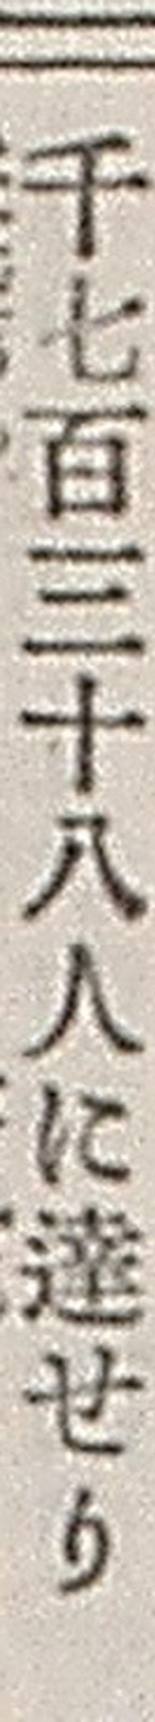千七百三十八人に達せり
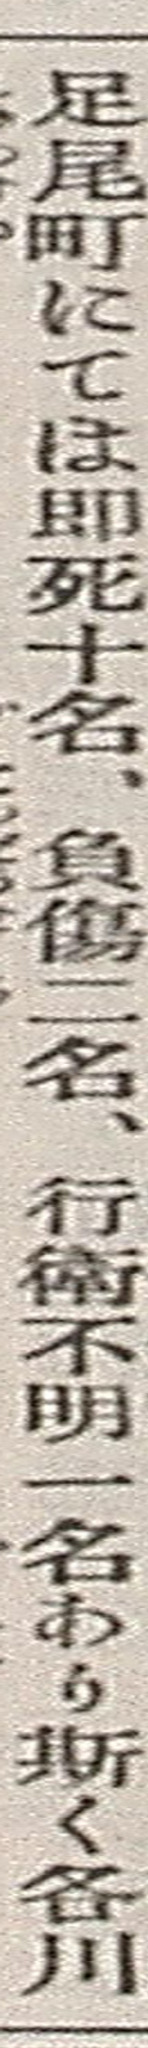足尾町にては即死十名、負傷二名、行衛不明一名あり斯く各川
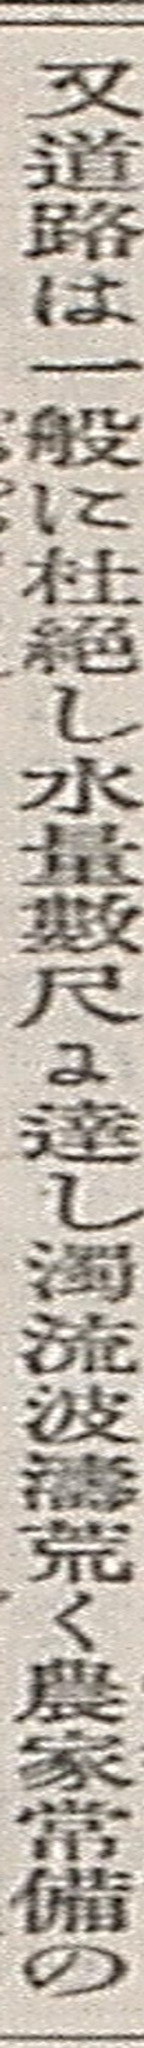又道路は一般に杜絶し水量数尺に達し濁流波濤荒く農家常備の
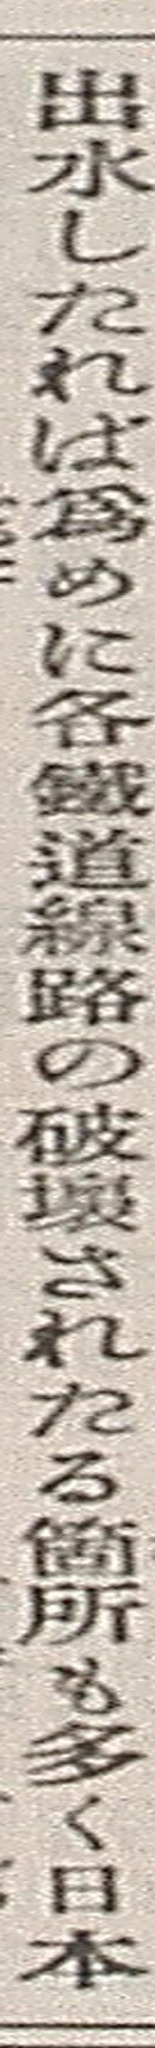出水したれば為めに各鉄道線路の破壊されたる箇所も多く日本
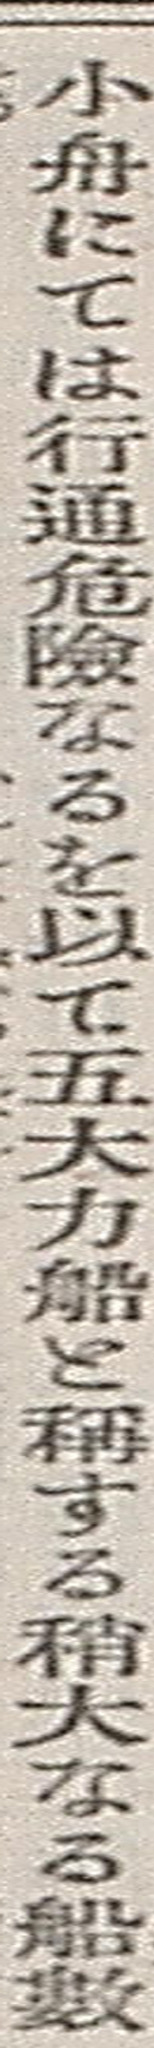小舟にては行通危険なるを以て五大力船と称する稍大なる船数
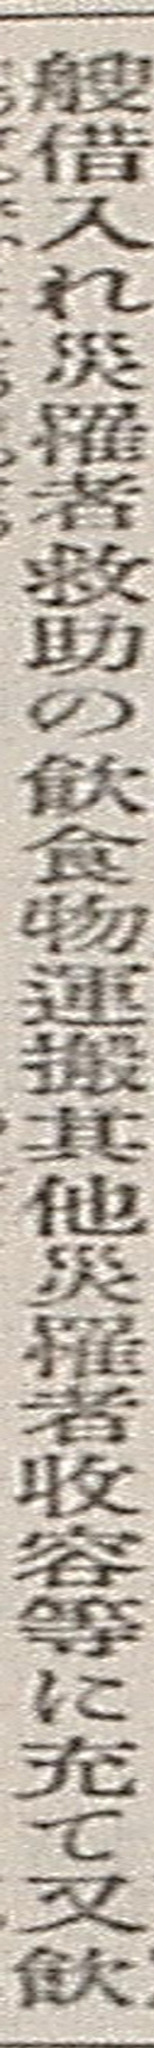艘借入れ災罹者救助の飲食物運搬其他災罹者収容等に充て又飲
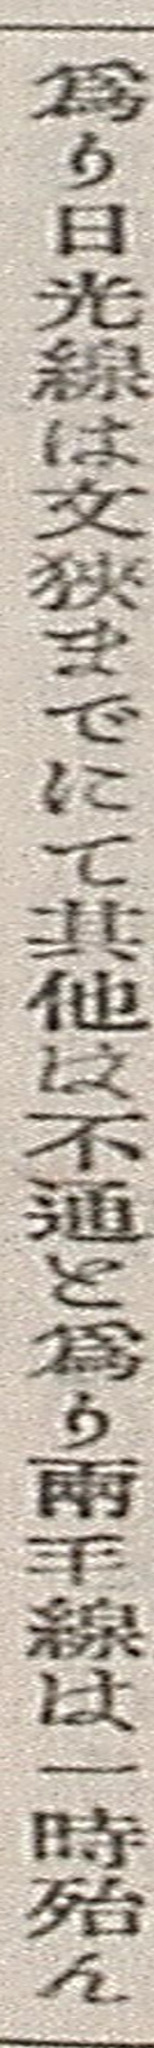為り日光線は文挟までにて其他は不通と為り両毛線は一時殆ど
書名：風俗畫報臨時増刊第百二十八號　洪水被害録（下）
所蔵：東京大学地震研究所図書室 Earthquake Research Institute Library, The University of Tokyo, JAPAN
